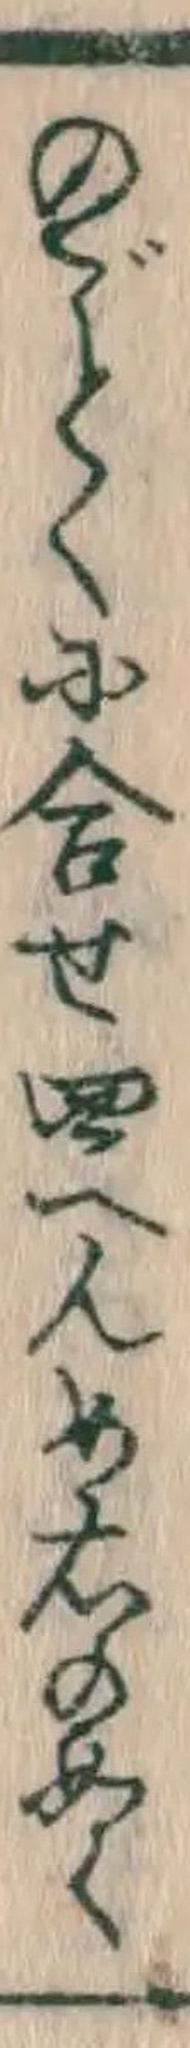のごとくに合せ四へんめ右の如く
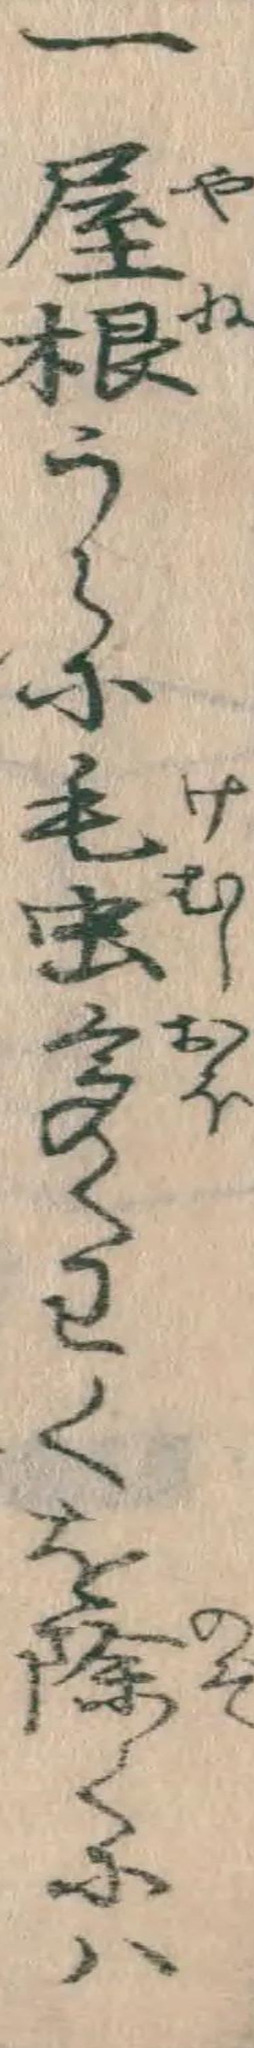一屋根うらに毛虫多くわくを除くには
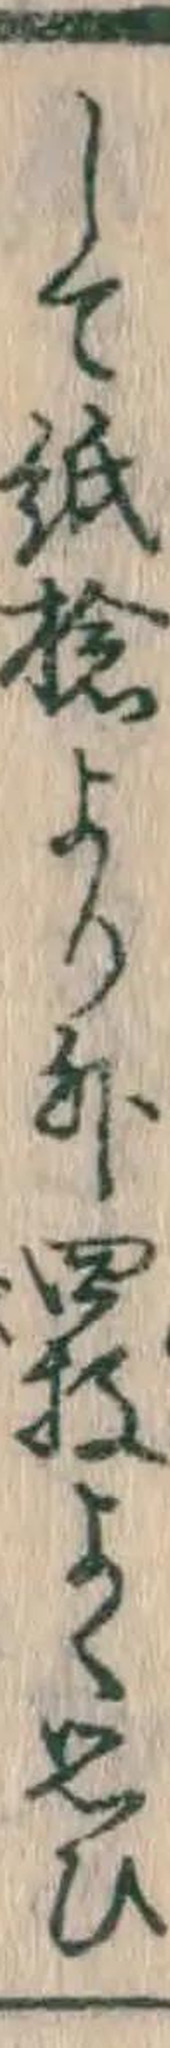して紙捻より外四枚よく思ひ
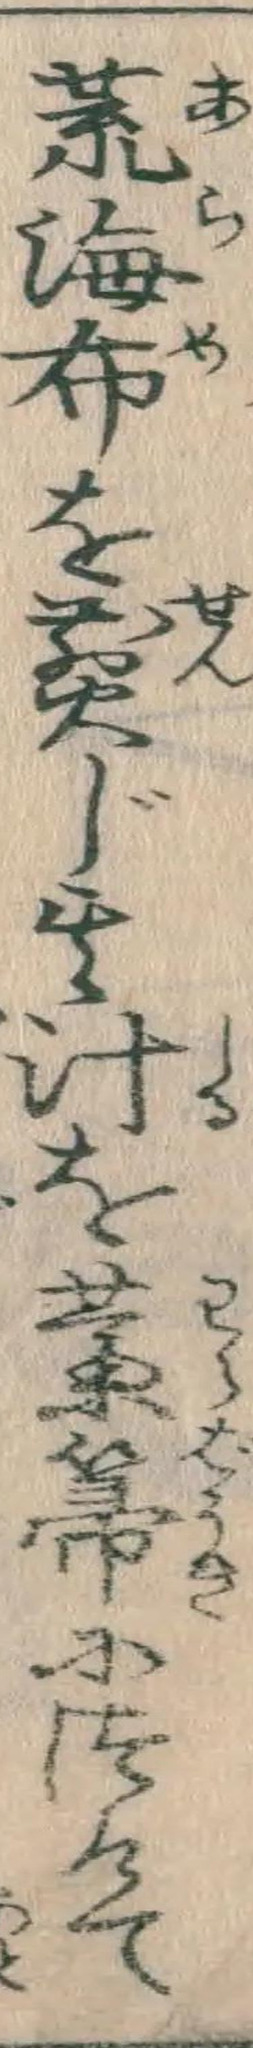荒海布を煎じ其汁を藁箒につけて
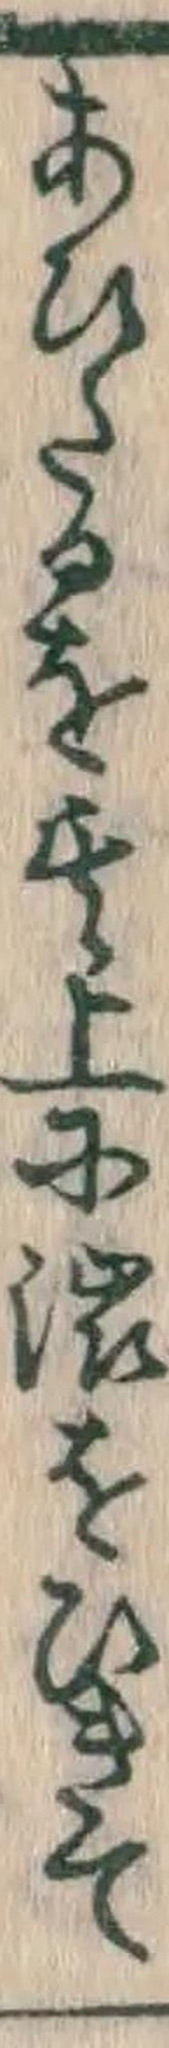あひたるを其上に渋をひきて
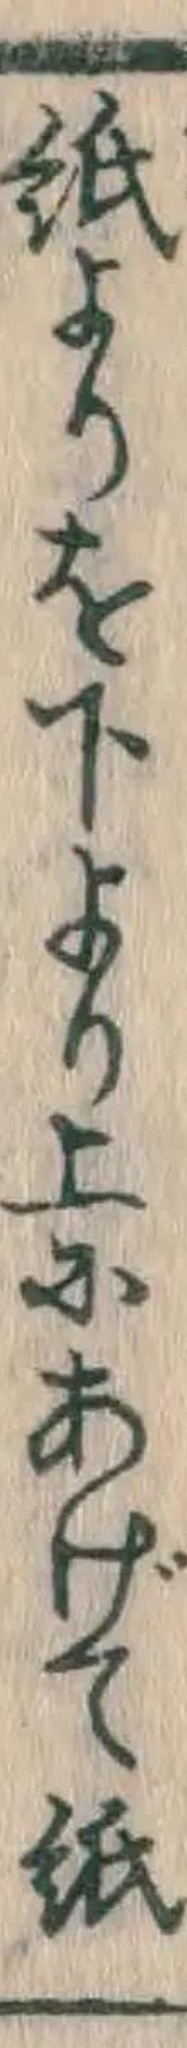紙よりを下より上にあげて紙
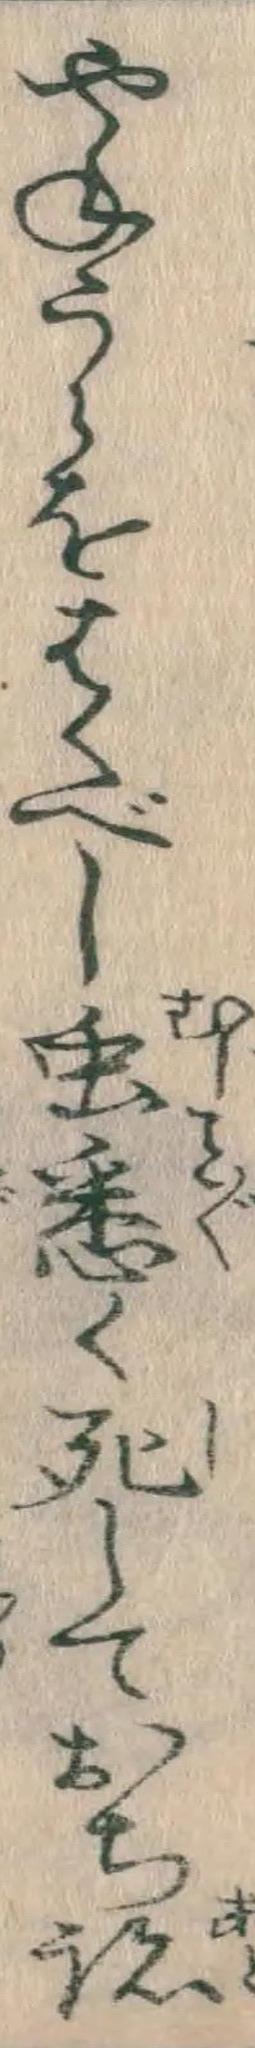やねうらをはくべし虫悉く死しておち跡
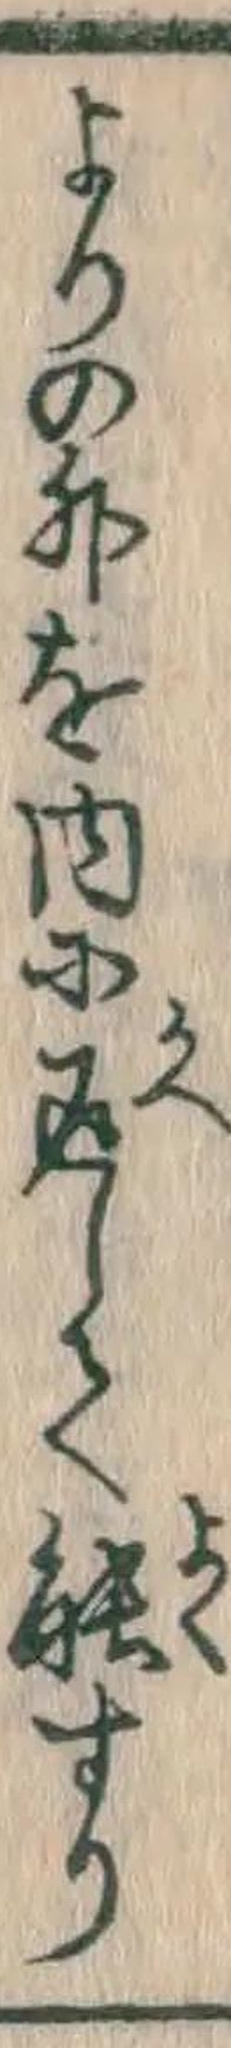よりの外を内に返して能すり
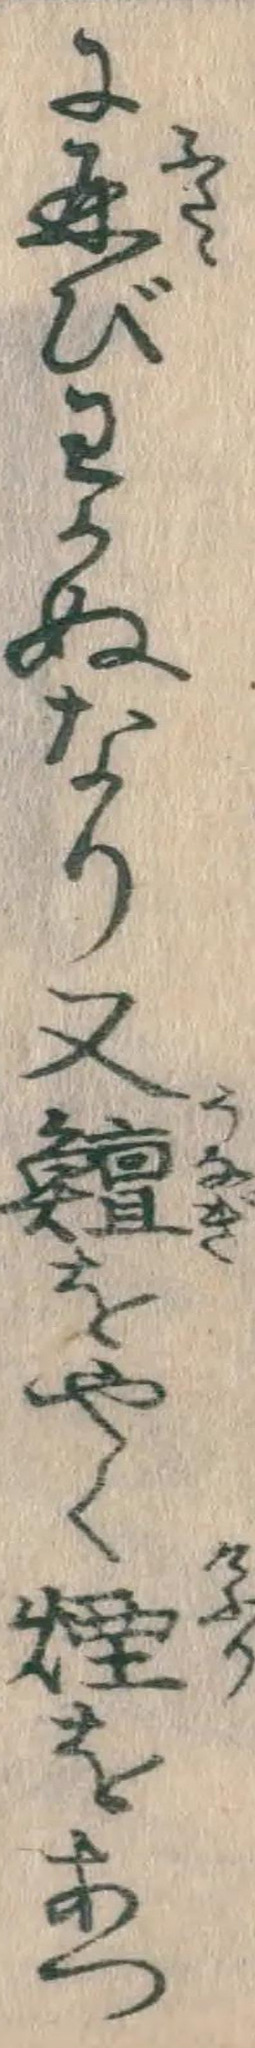に再びわかぬり又鱣をやく煙をあつ
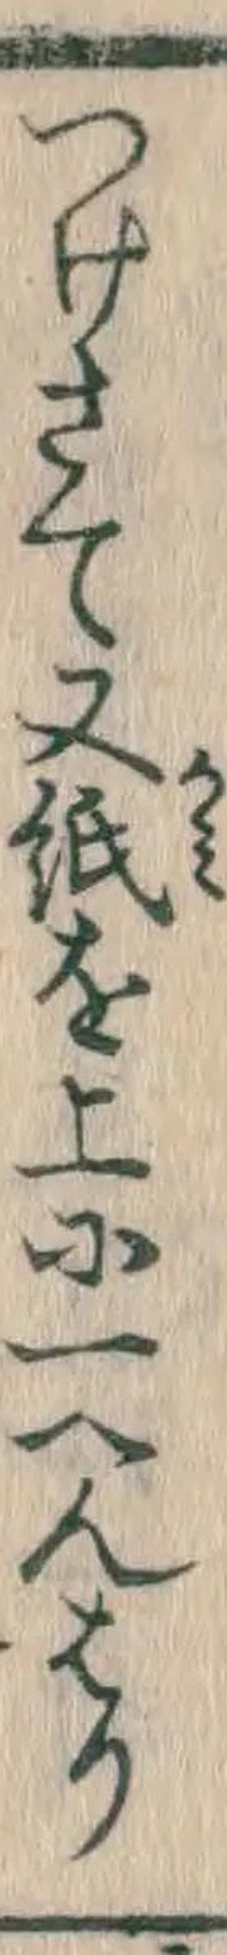つけさて又紙を上に一へんはり
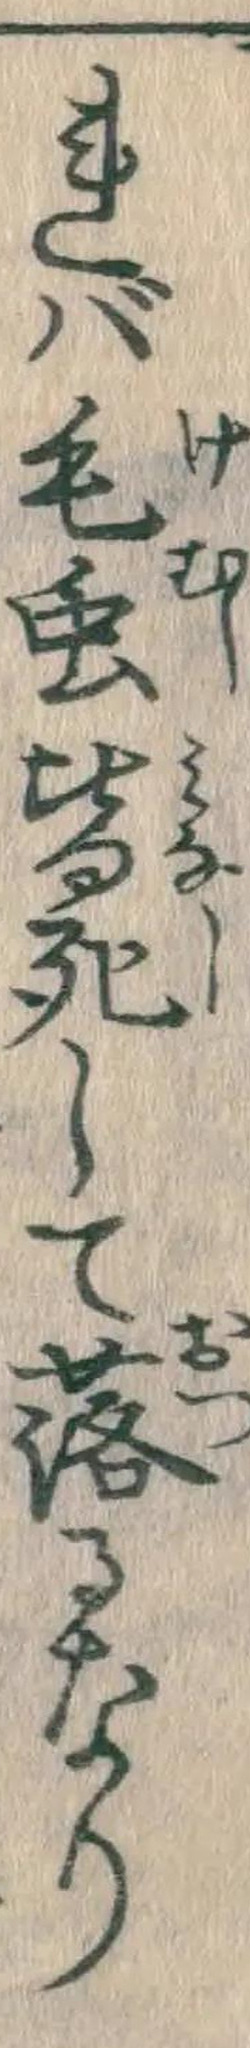れば毛虫皆死して落るなり
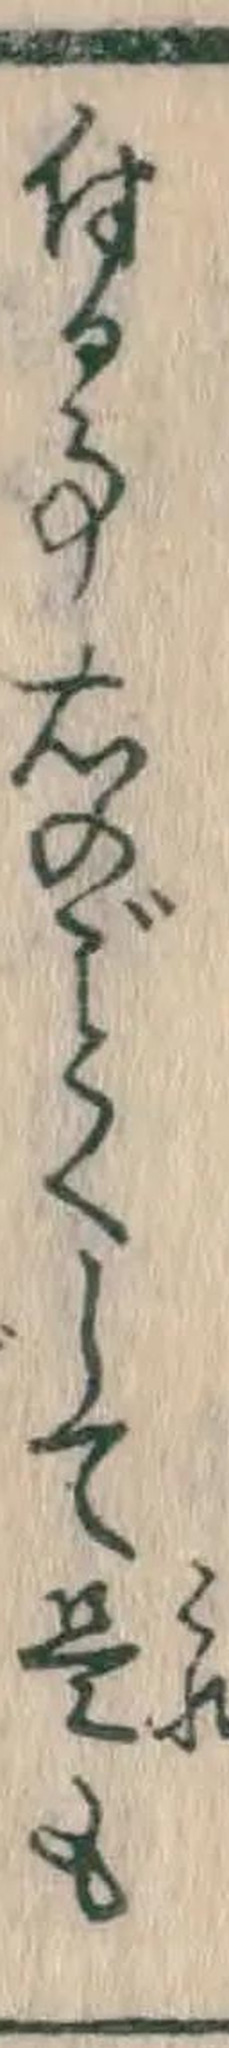付る事右のごとくして是も
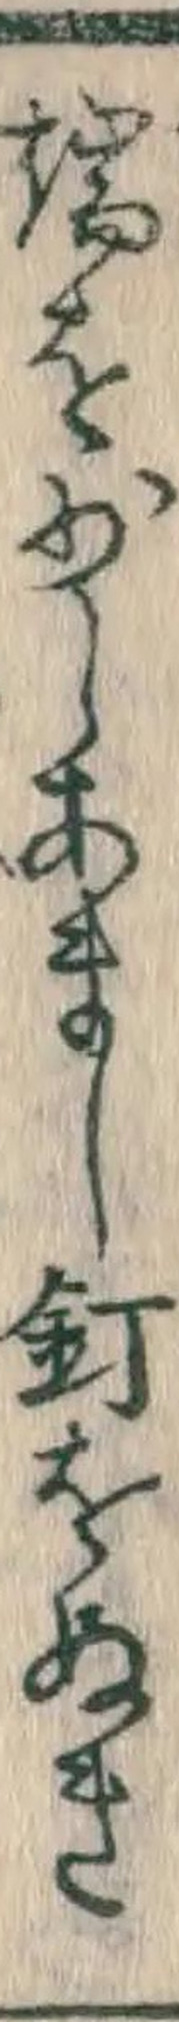端を少しあまし釘をぬき
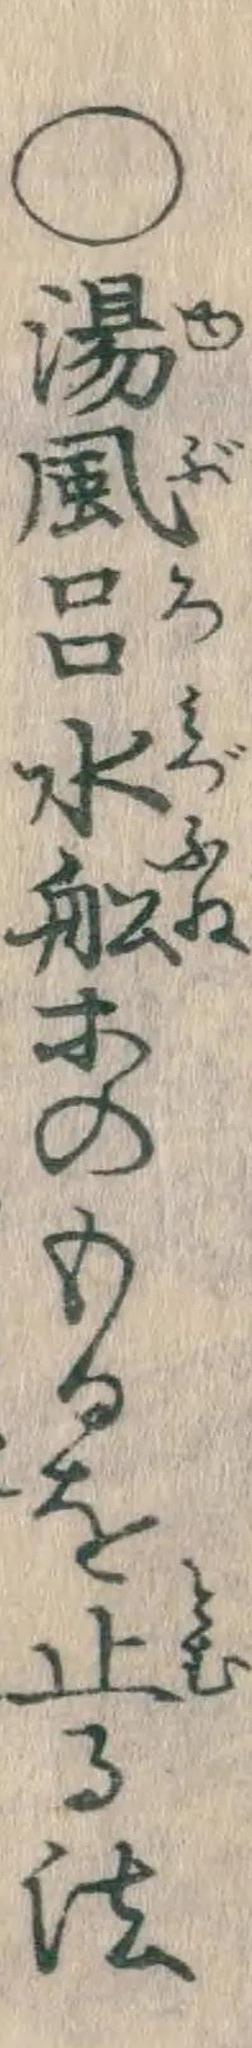○湯風呂水船等のもるを止る法
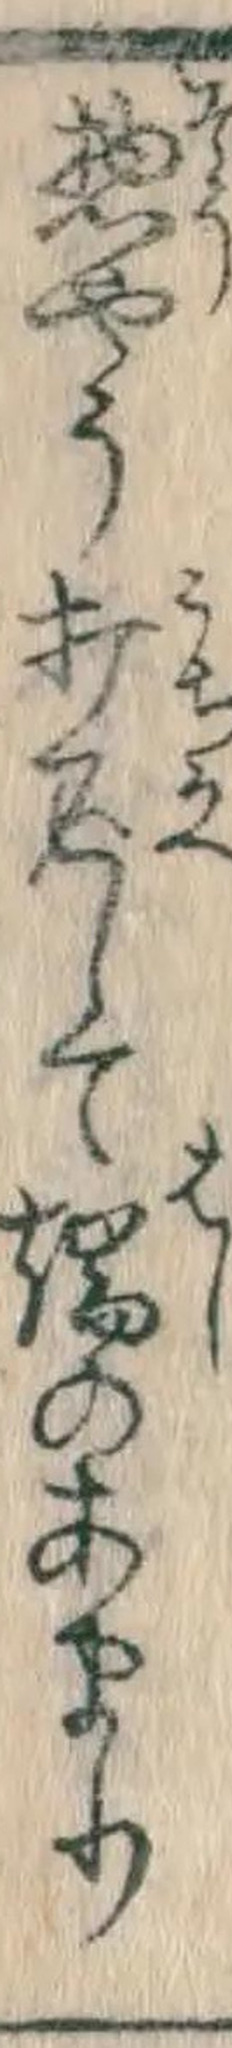惣やう打返して端のあまり
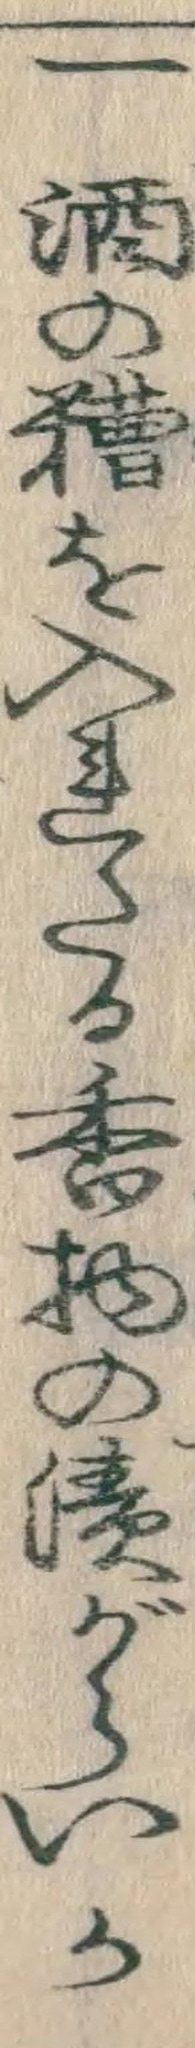一酒の糟を入れたる香物の漬がらいか
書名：広益秘事大全 3巻. [2]
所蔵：国立国会図書館 National Diet Library, JAPAN
